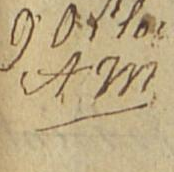AM
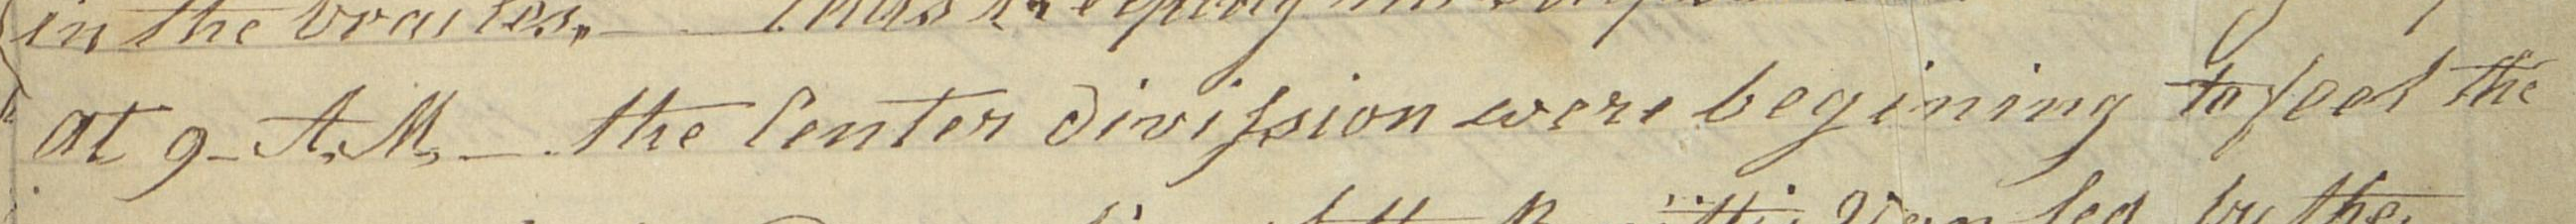At 9 A.M. the Center divission were begining to feel the
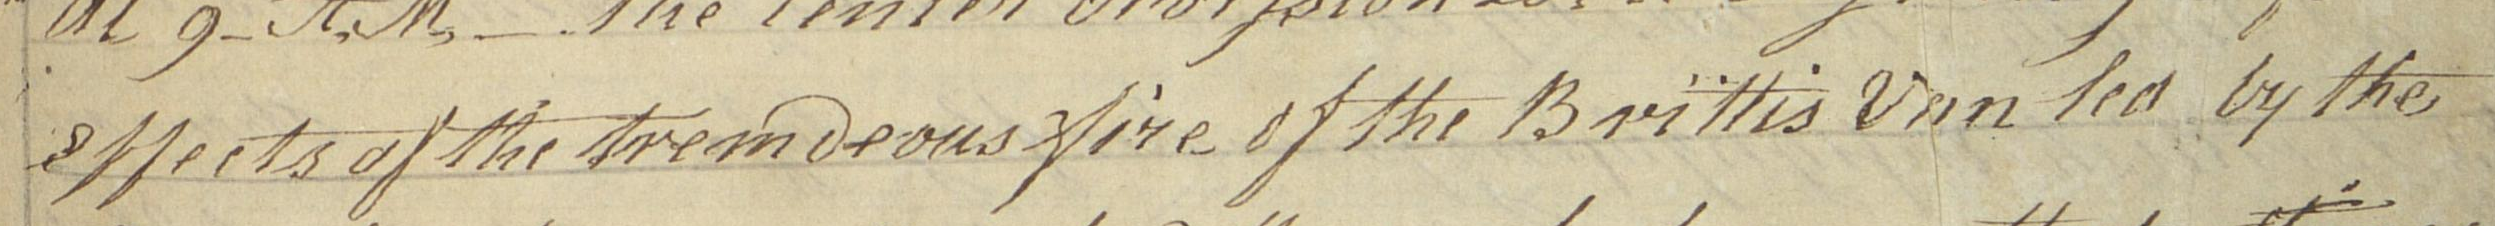Effects of the tremdeous fire of the Brittis Van led by the
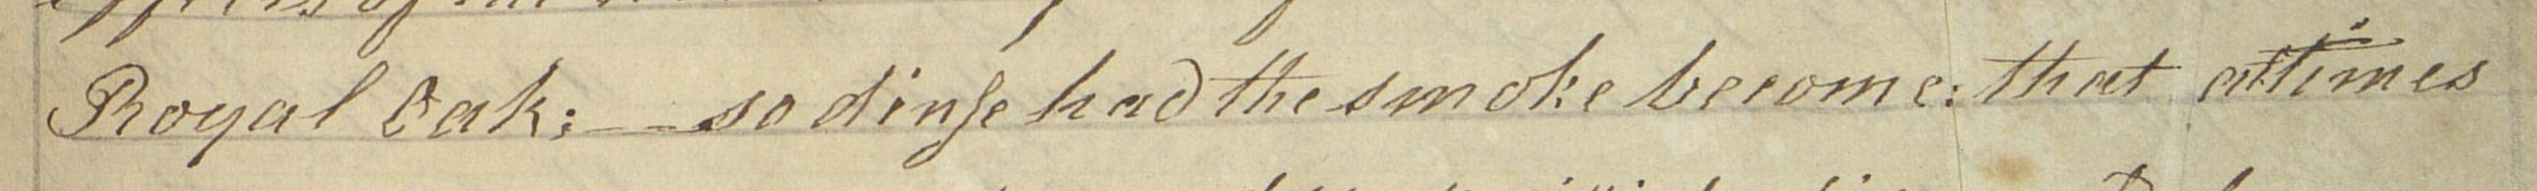Royal Oak; so dinse had the smoke become: that at times
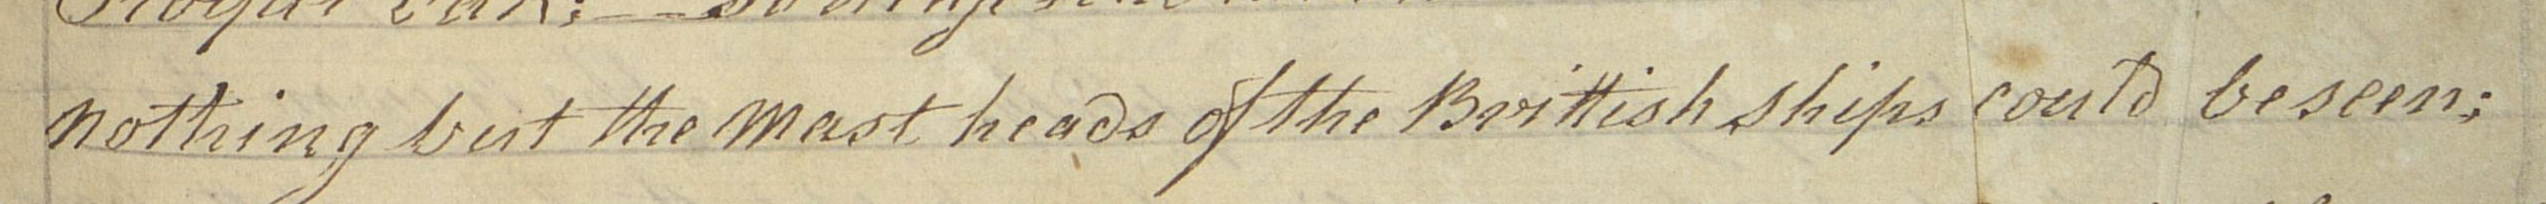nothing but the Mast heads of the Brittish ships could be seen;
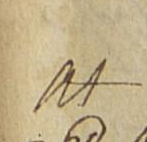At
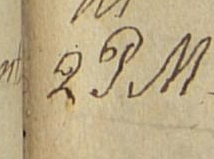2PM.
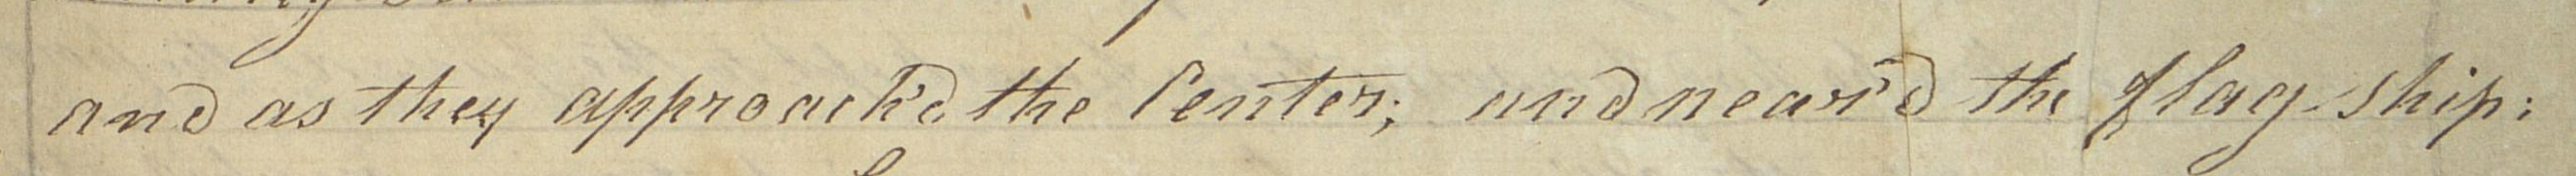and as they approach'd the Center; and near'd the flag ship;
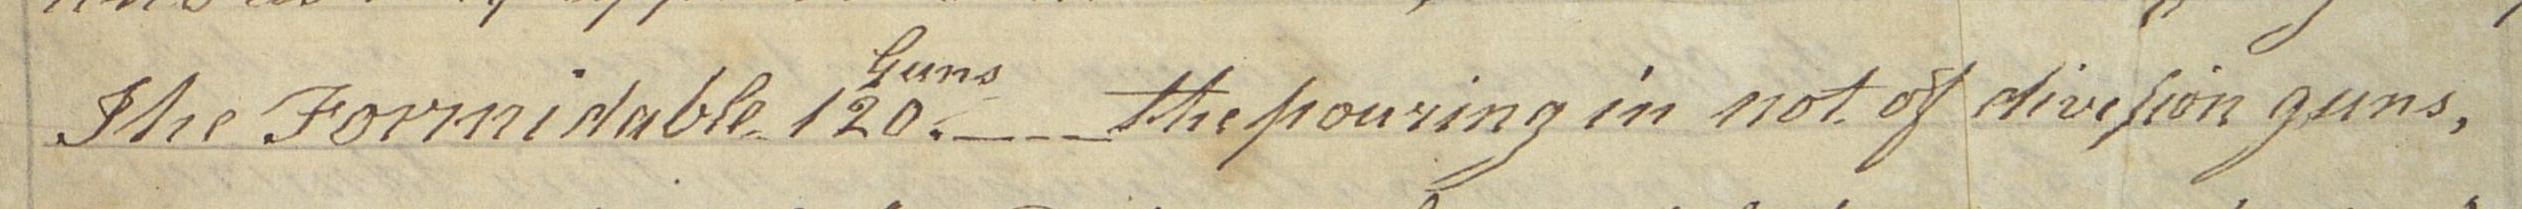The Formidable 120 ^ the pouring in not of division guns,
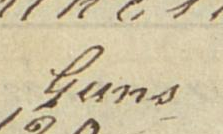Guns
